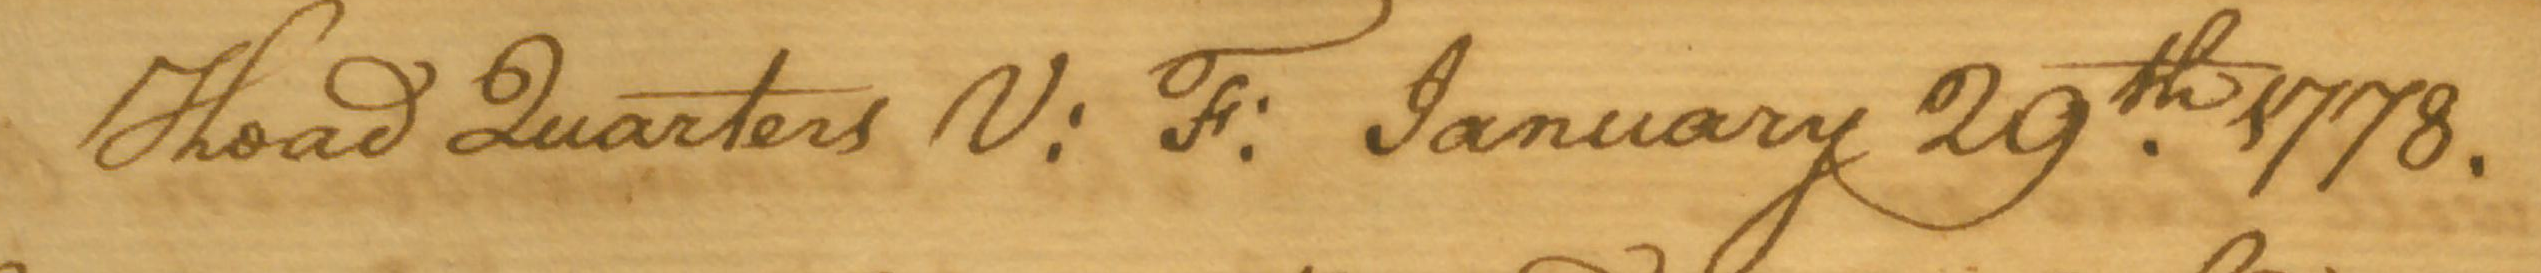Head Quarters V: F: January 29^th. 1778.
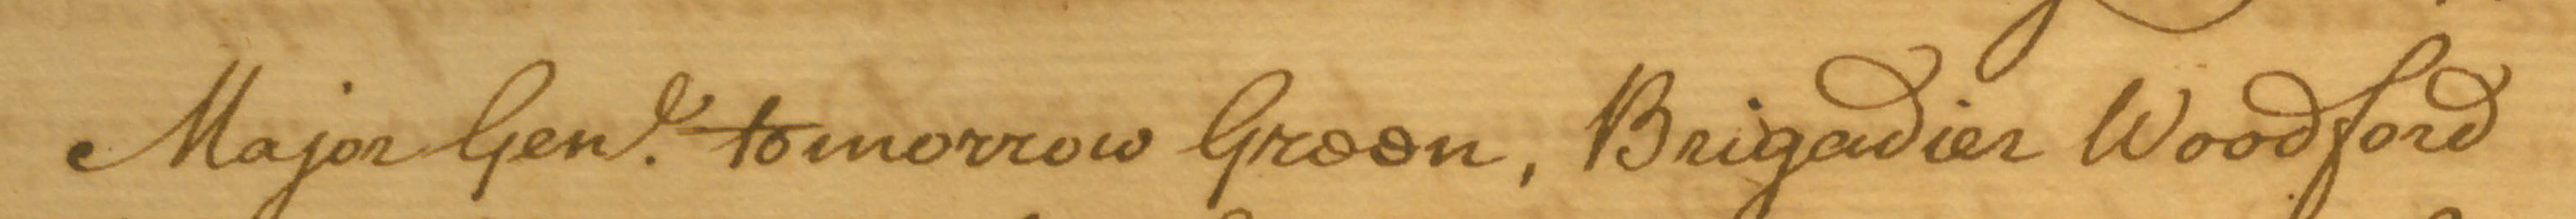Major Gen^l. tomorrow Green, Brigadier Woodford
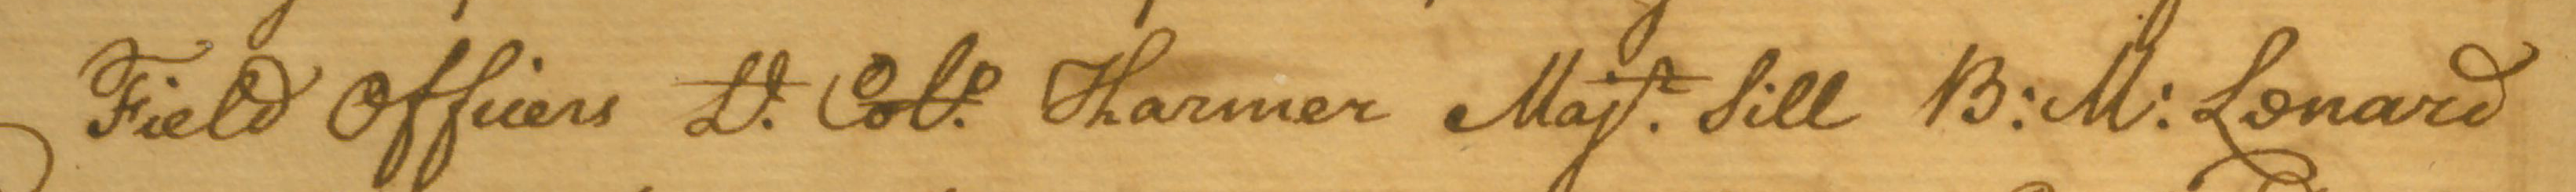Field Officers L^t. Col^o. Harmer Maj^r. Sill B: M: Lenard
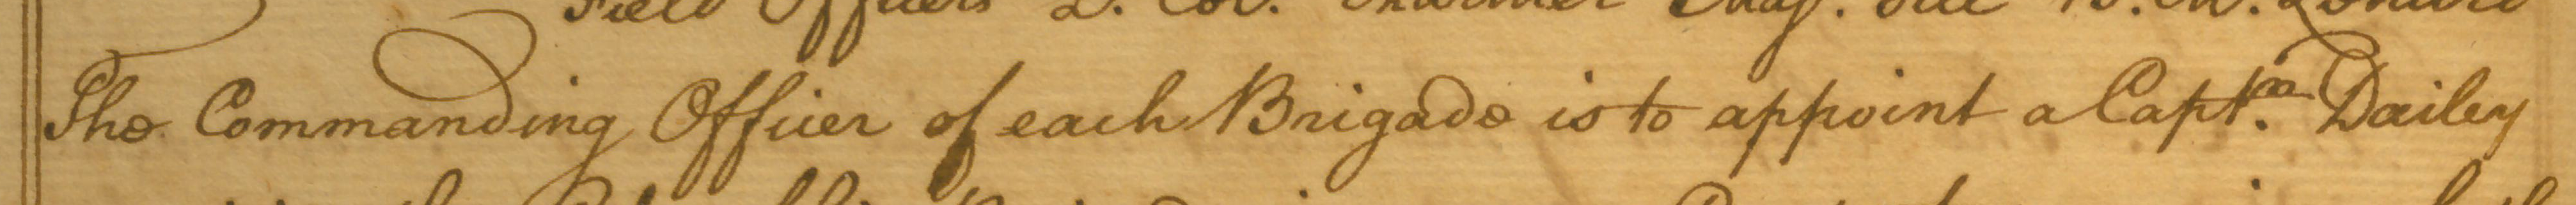The Commanding Officer of each Brigade is to appoint a Capt^n. Dailey
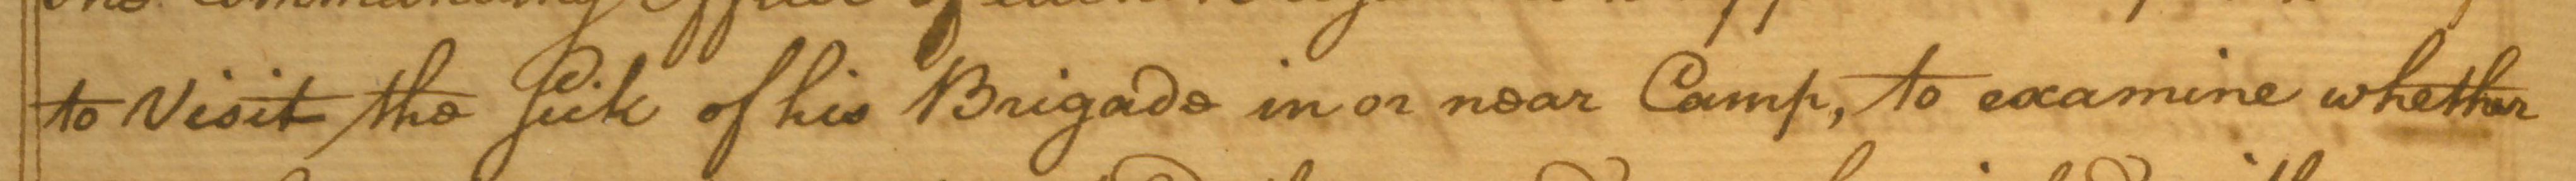to visit the sick of his Brigade in or near Camp, to examine whether
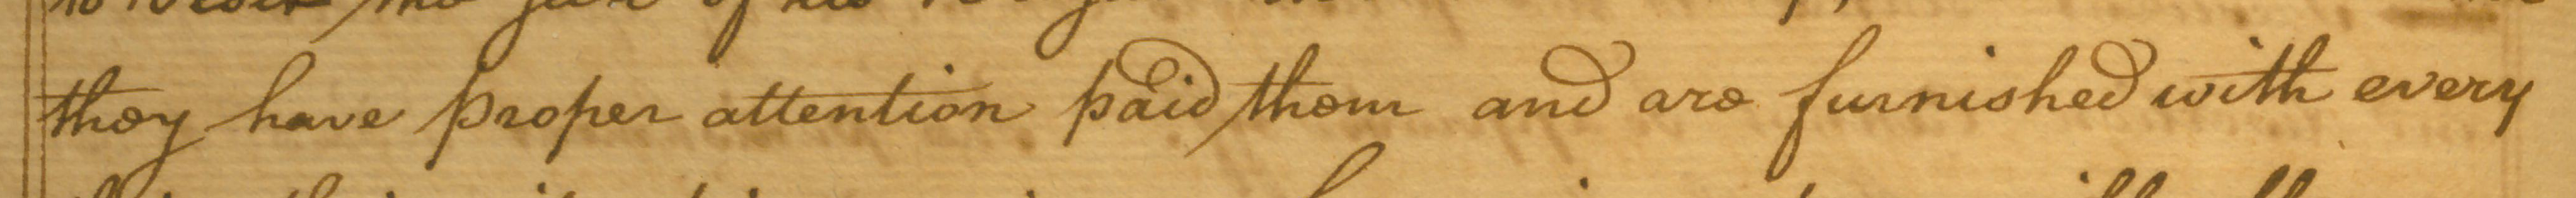they have proper attention paid them and are furnished with every
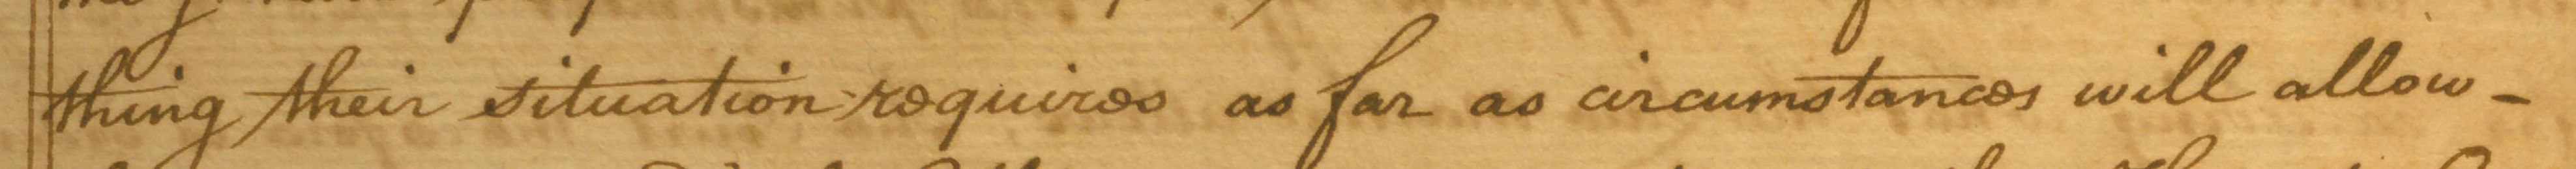thing their situation requires as far as circumstances will allow-
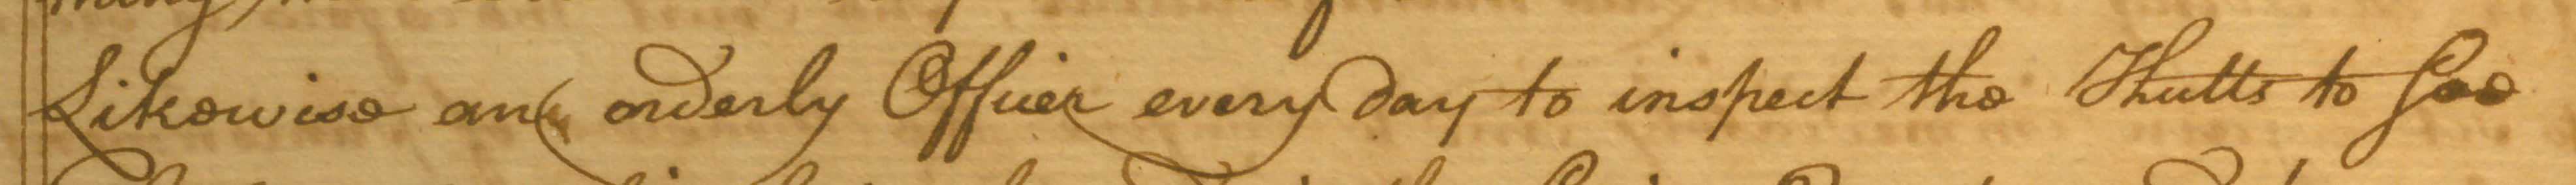Likewise an orderly Officer every day to inspect the Hutts to see
